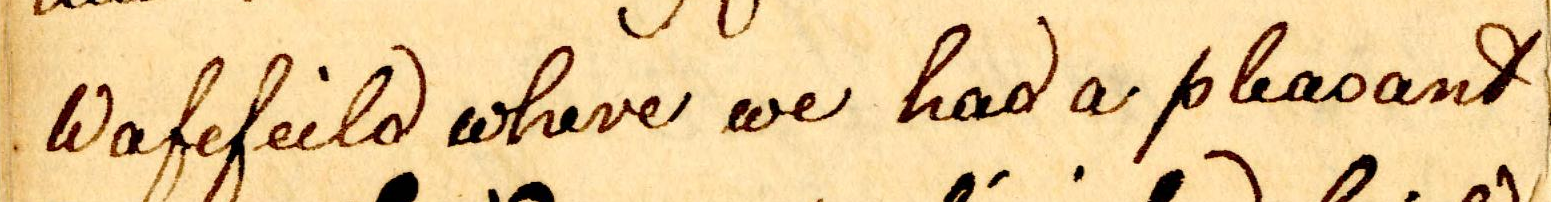Wafefeild where we had a pleasant
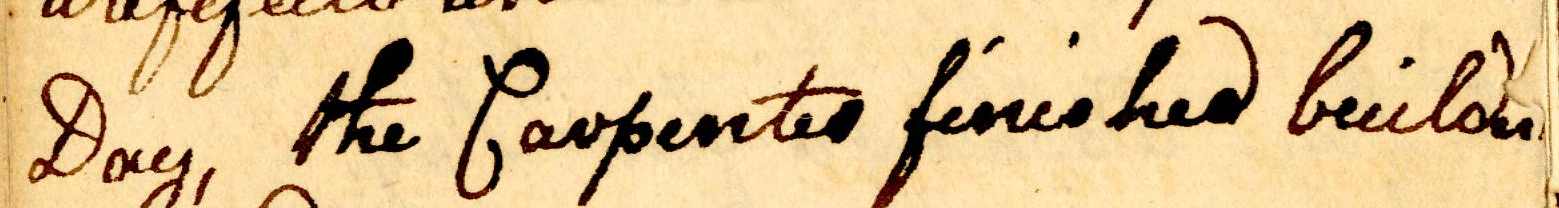Day, the Carpenter finished buildin
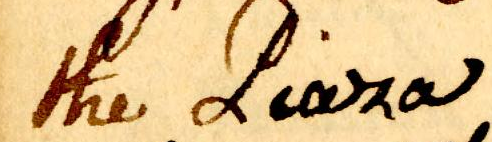the Piaza
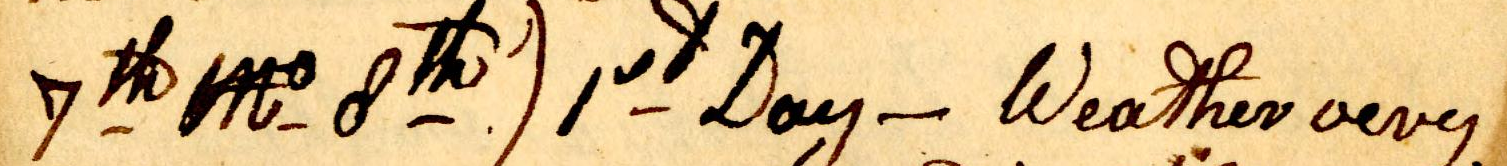7^th M^o 8^th) 1^st Day- Weather very
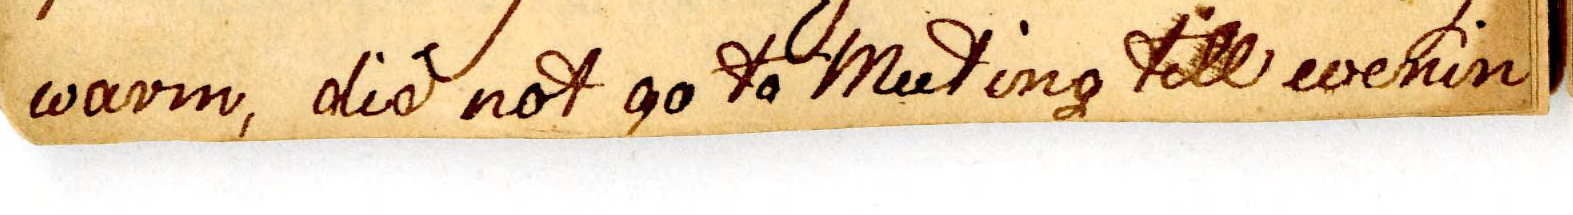warm, did not go to Meeting till evenin
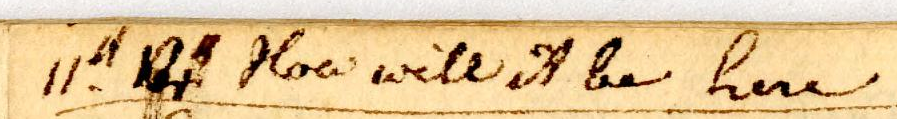11^th 14 How will it be here
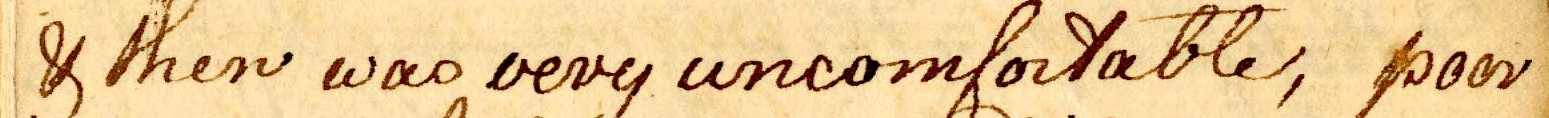& then was very uncomfortable, poor
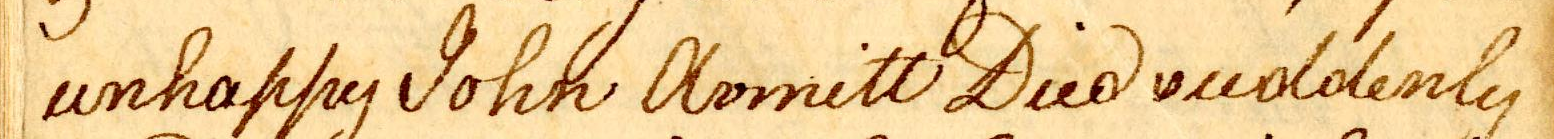unhappy John Armitt Died suddenly
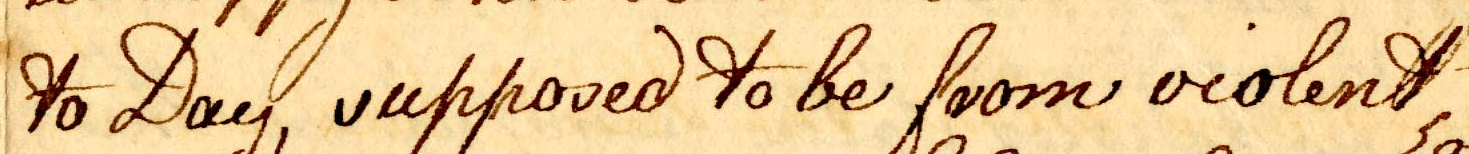to Day, supposed to be from violent
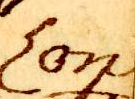on
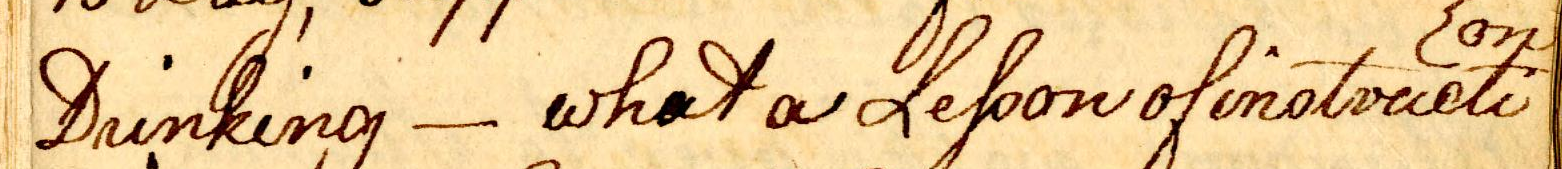Drinking- what a Lesson of instructi
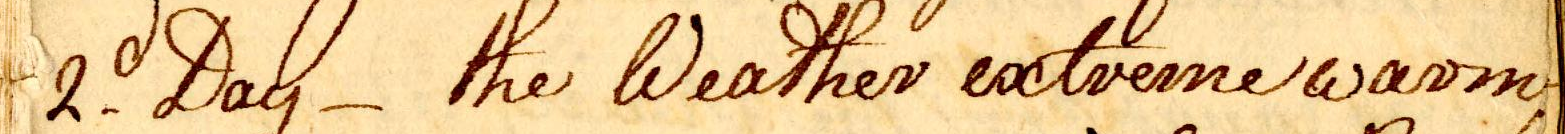2^d. Day- the Weather extreme warm
